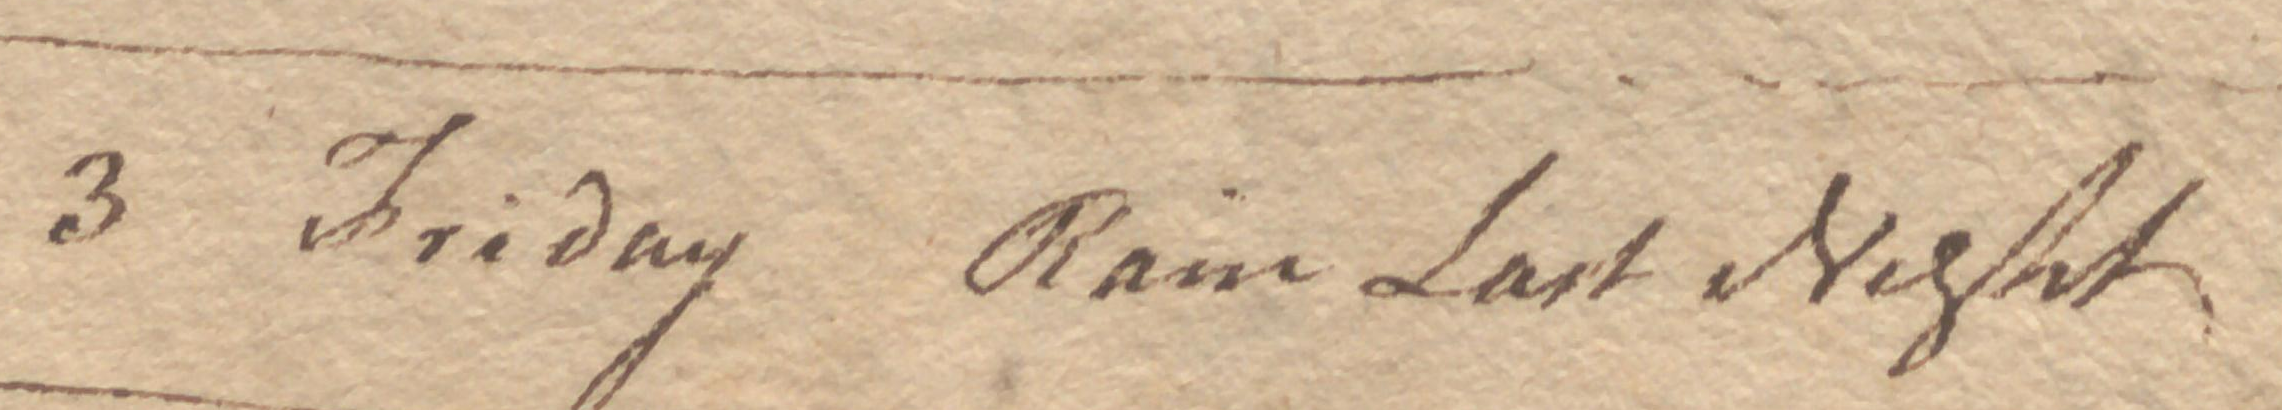3 Friday Rain Last Night
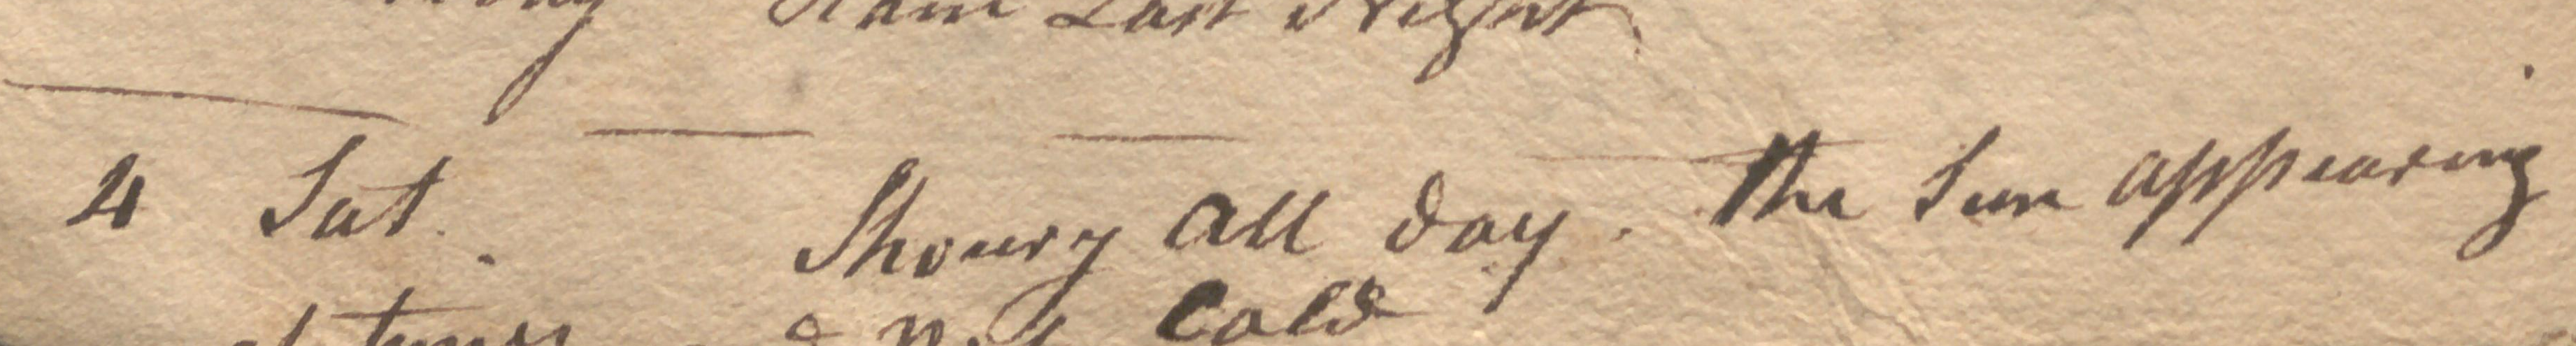4 Sat. Shoury all day. the Sun appearing
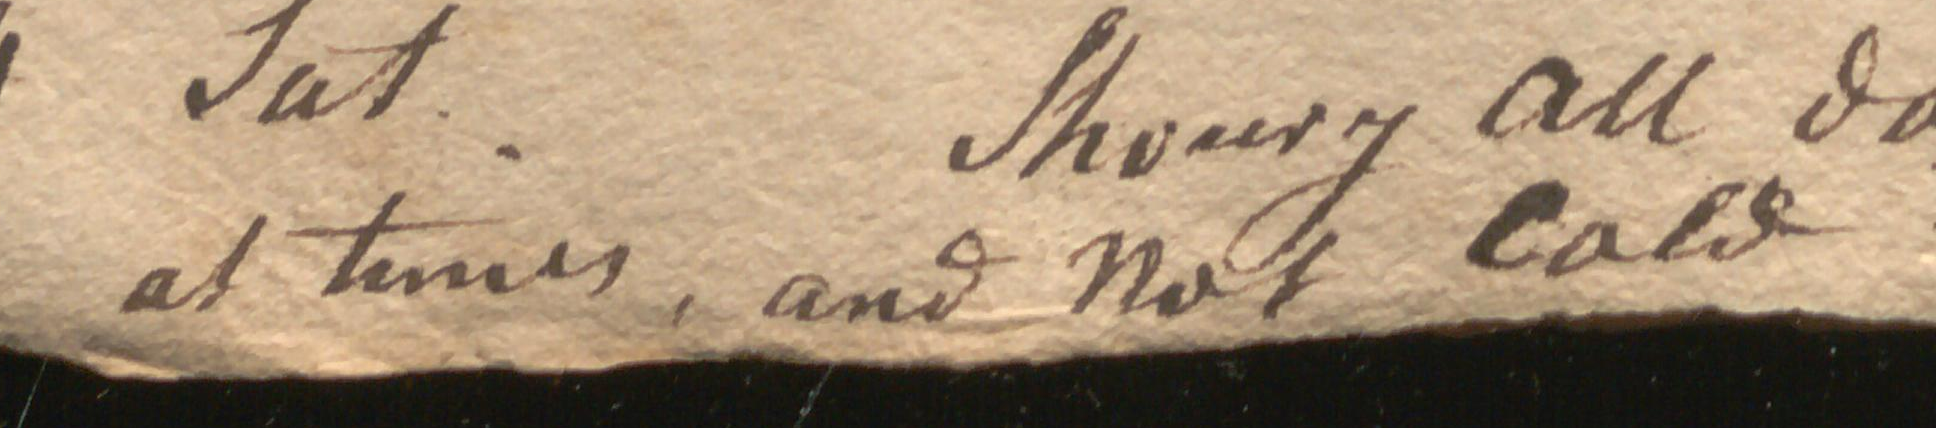at times, and not cold
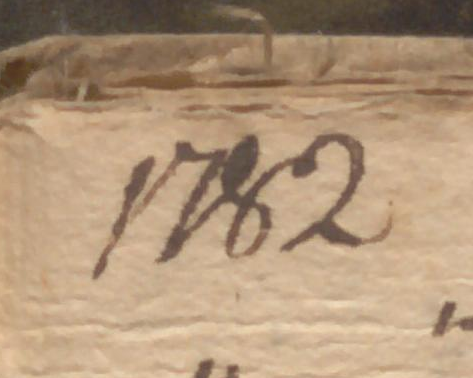1782
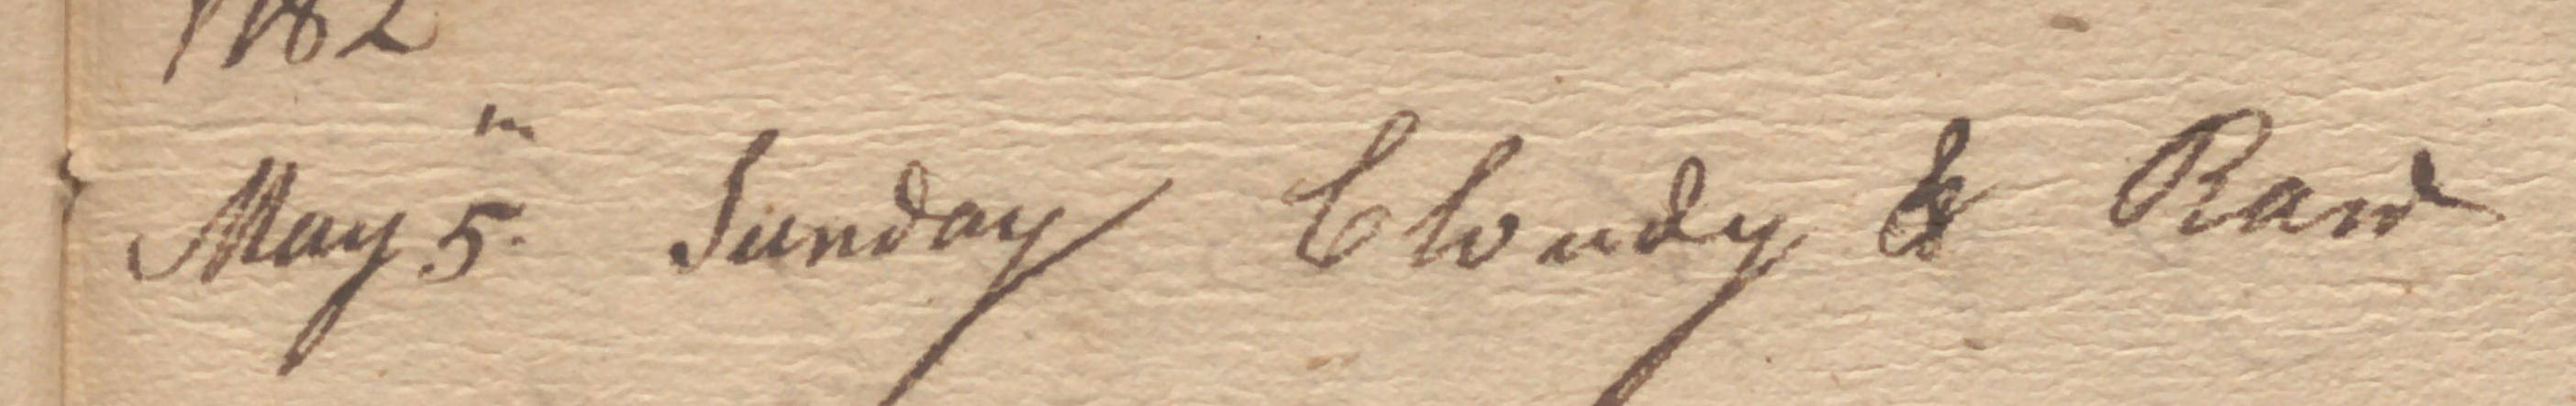May 5^th Sunday Cloudy & Raw
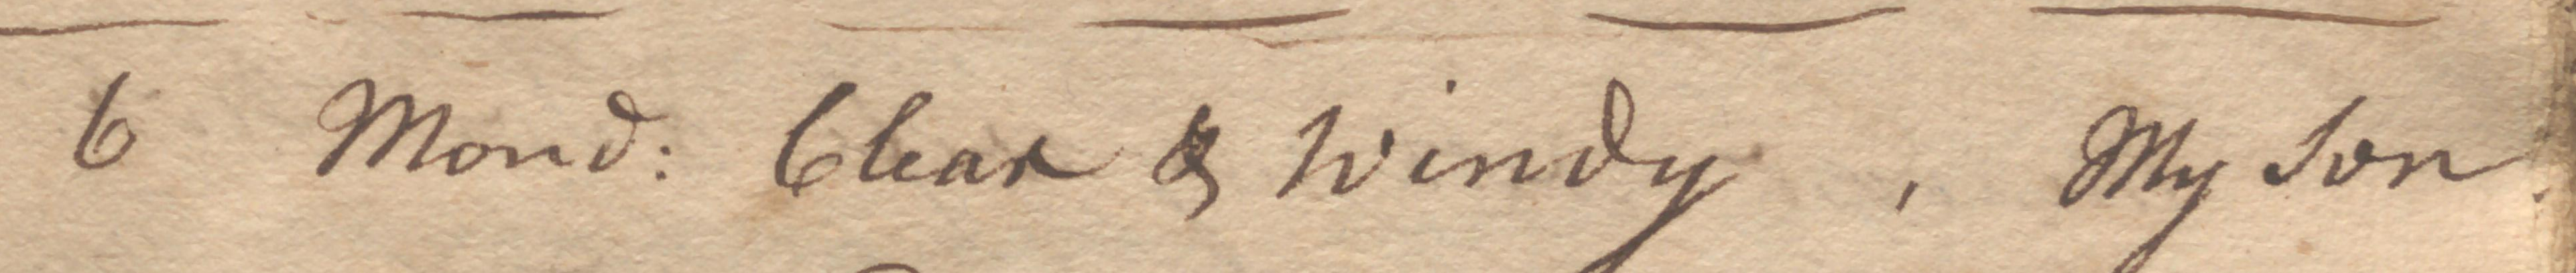6 Mond: Clear & Windy. My Son
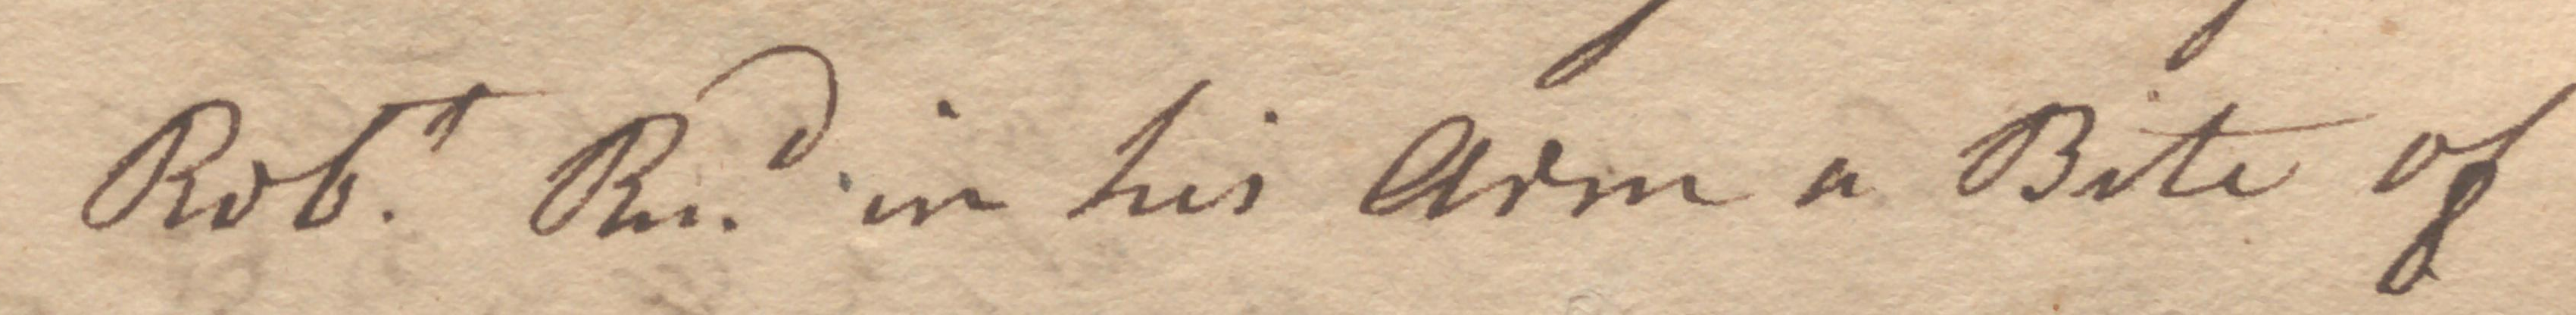Rob^t. Rec^d. in his Arm a Bite of
